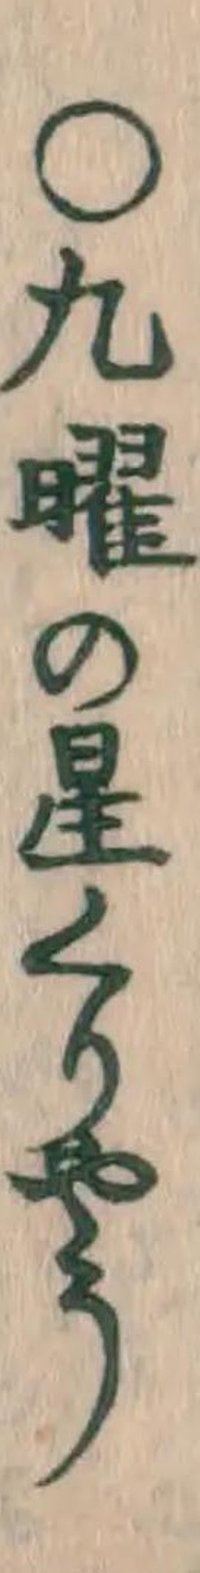○九曜の星くりやう
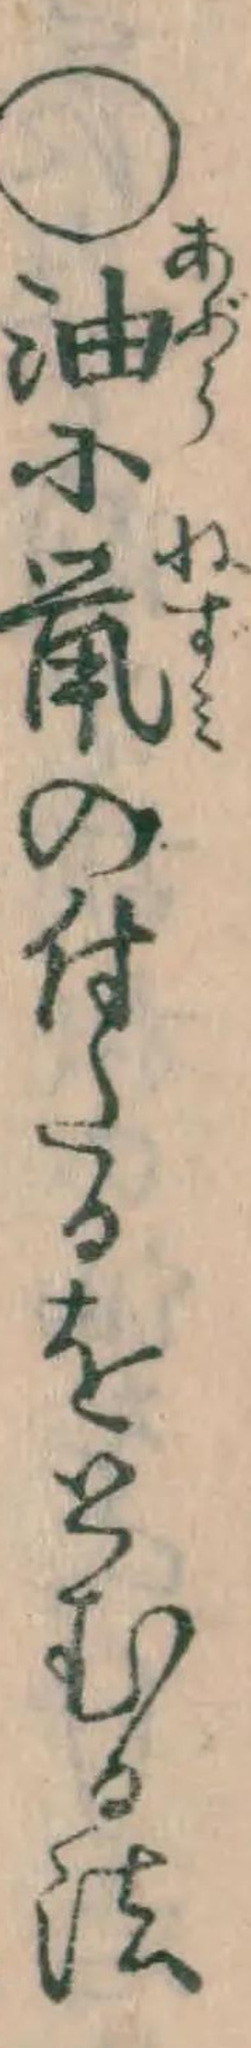○油に鼠の付たるをとむる法
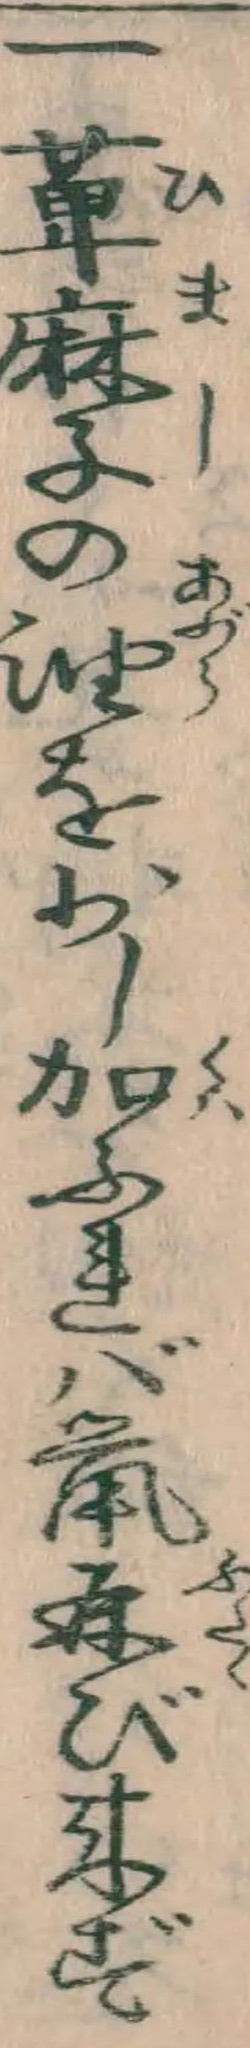一萆麻子の油を少し加ふれば鼠再び来ず
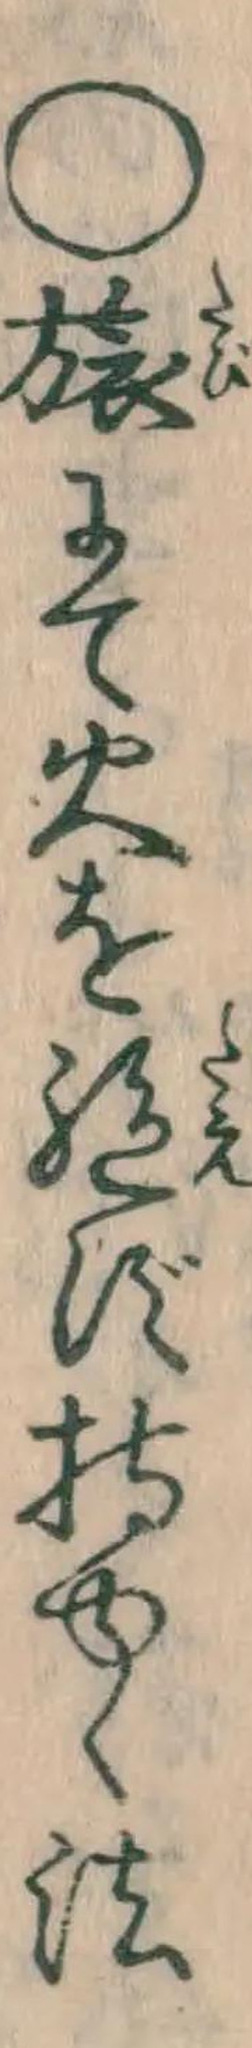○旅にて火を絶ず持ゆく法
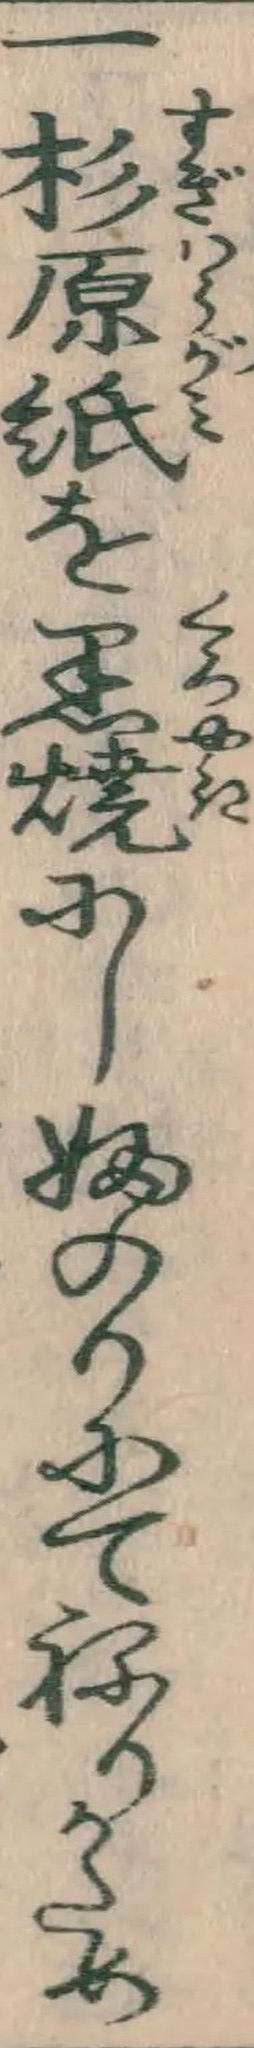一杉原紙を黒焼にしふのりにてねりかため
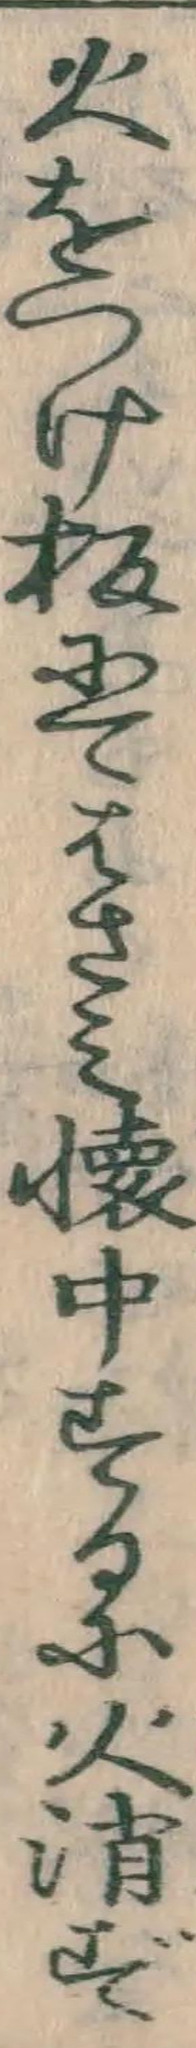火をつけ板にてはさみ懐中するに火消ず
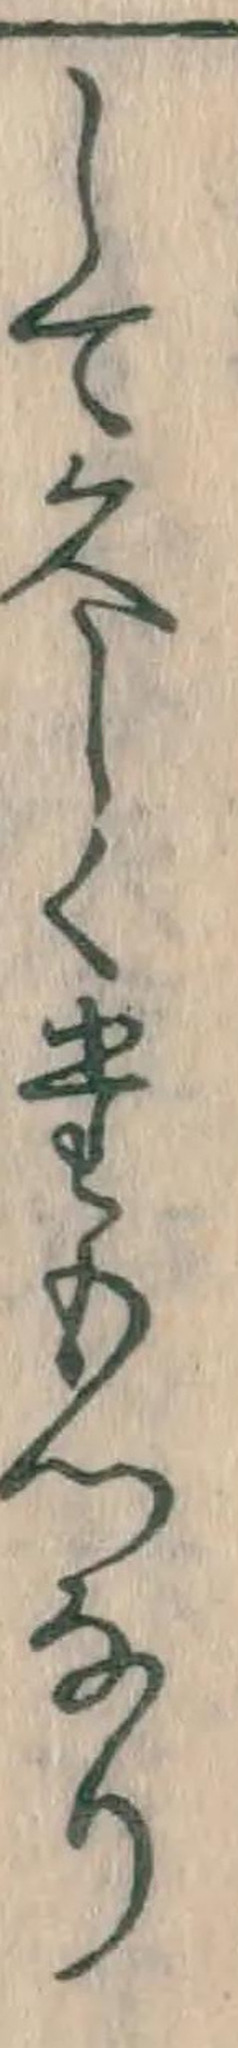して久しくたもつなり
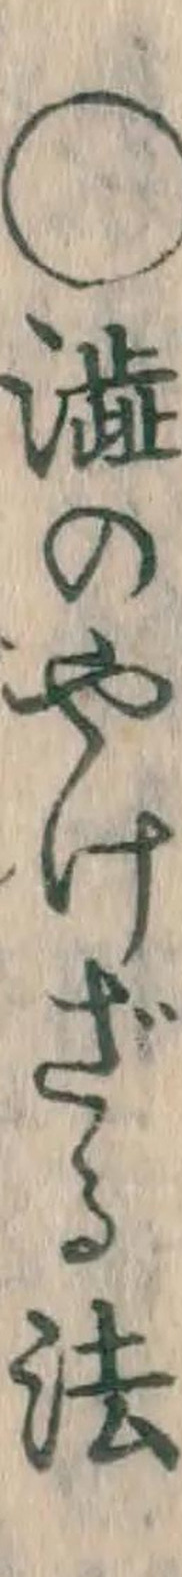○渋のやけざる法
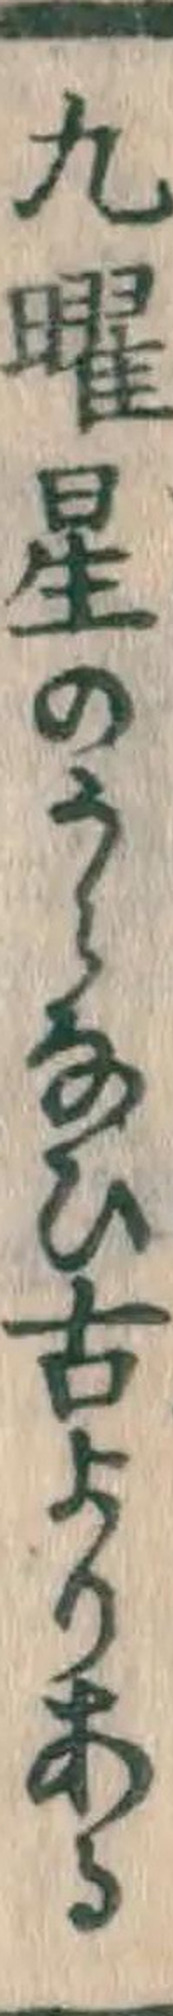九曜星のうらなひ古よりある
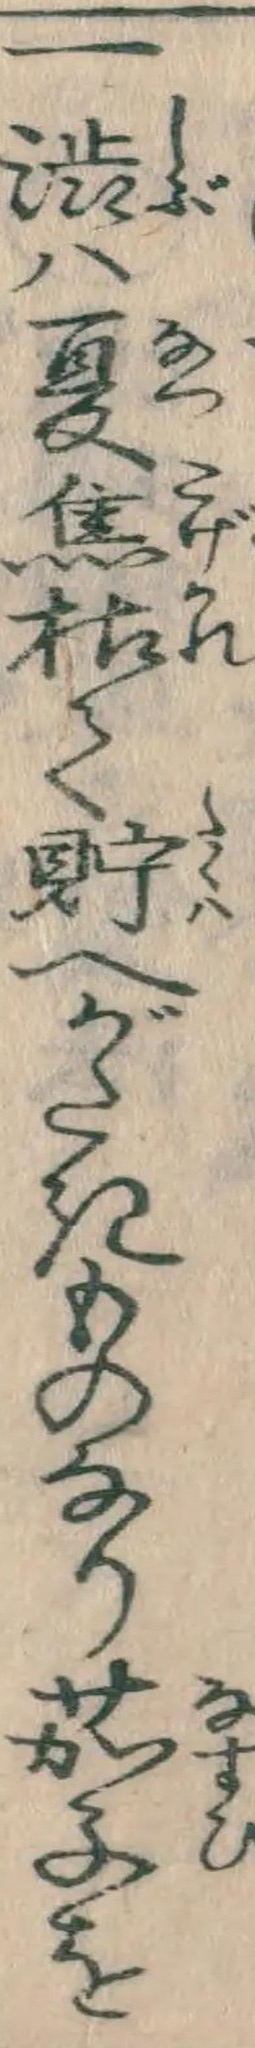一渋は夏焦枯て貯へがたきものなり茄子を
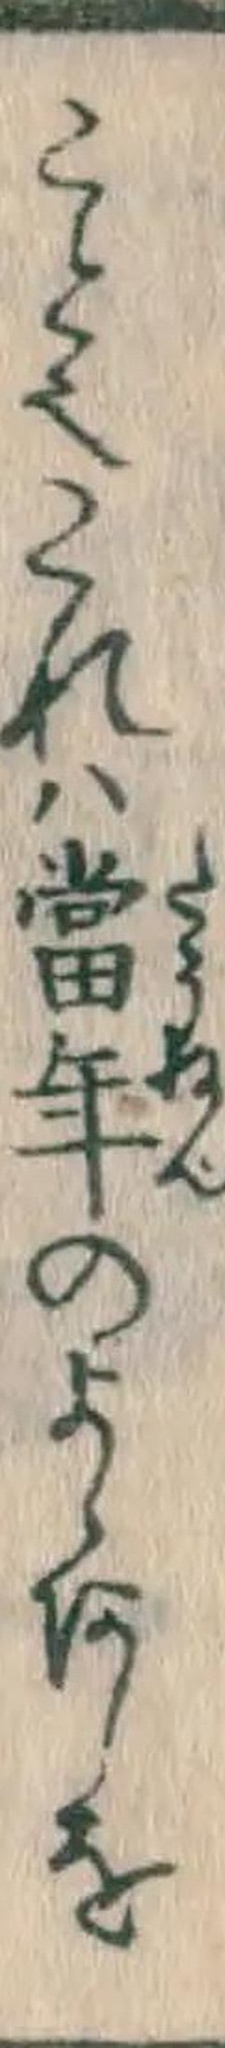こと也これは当年のよしあしを
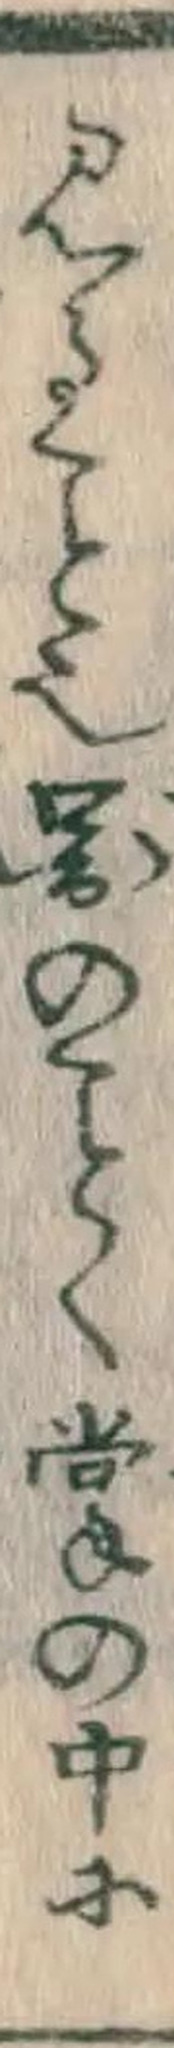見ること也図のことく掌の中に
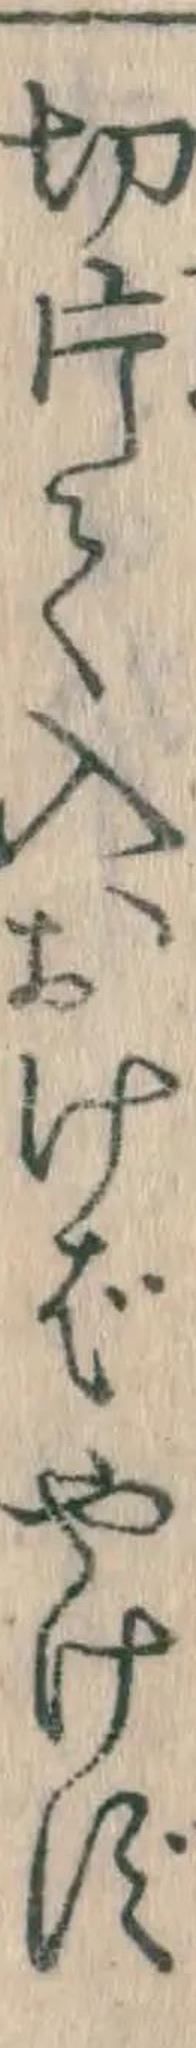切片て入おけばやけず
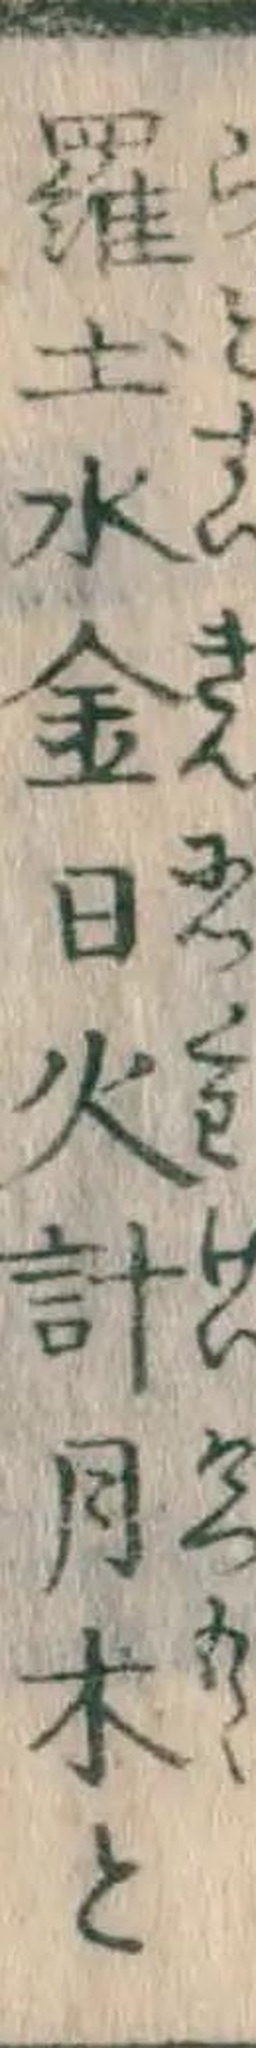羅土水金日火計月木と
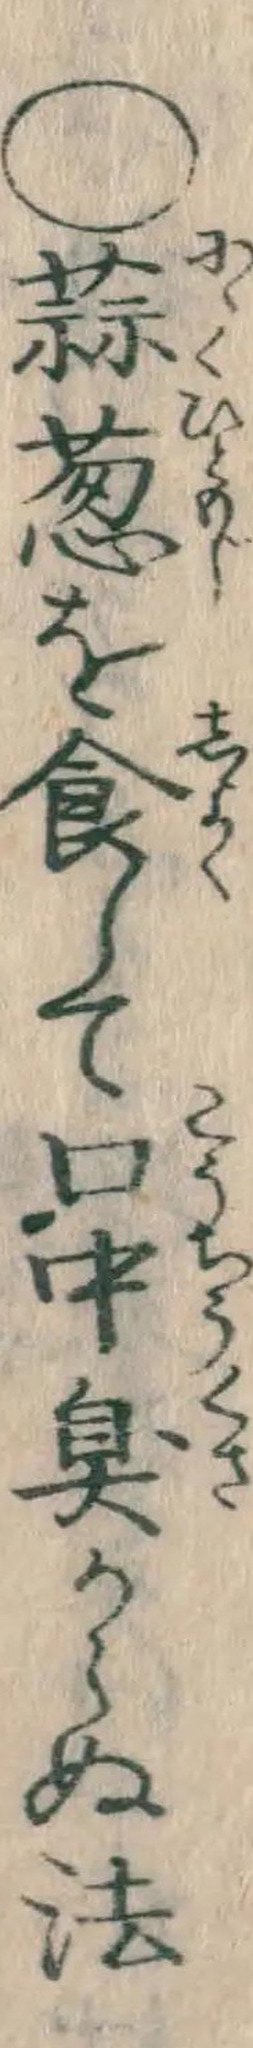○蒜葱を食して口中臭からぬ法
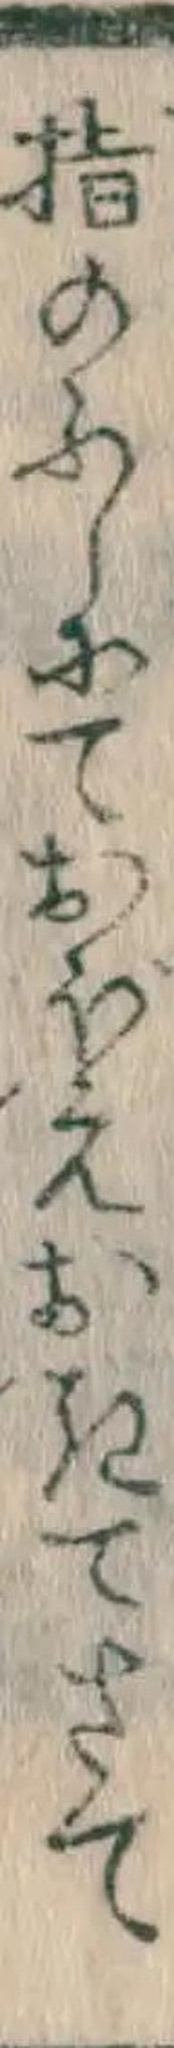指のふしにておぼえおきてさて
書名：広益秘事大全 3巻. [1]
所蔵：国立国会図書館 National Diet Library, JAPAN
